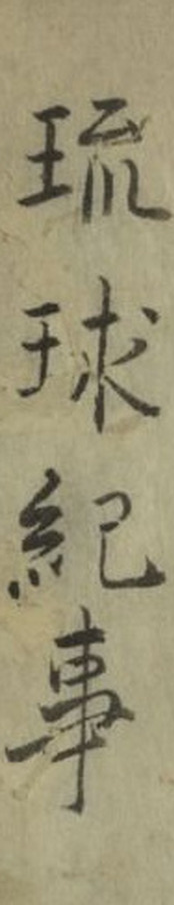琉球紀事

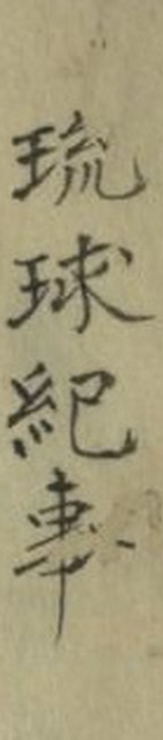琉球紀事
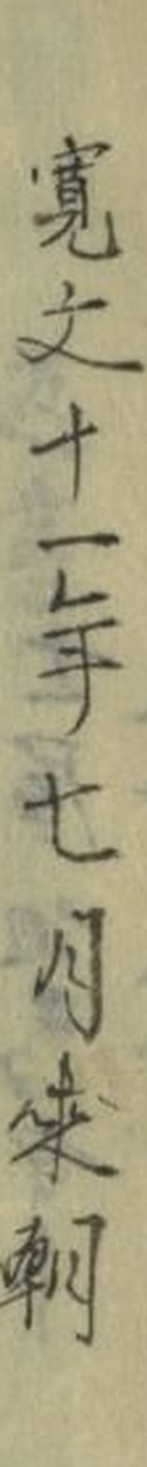寛文十一年七月来朝
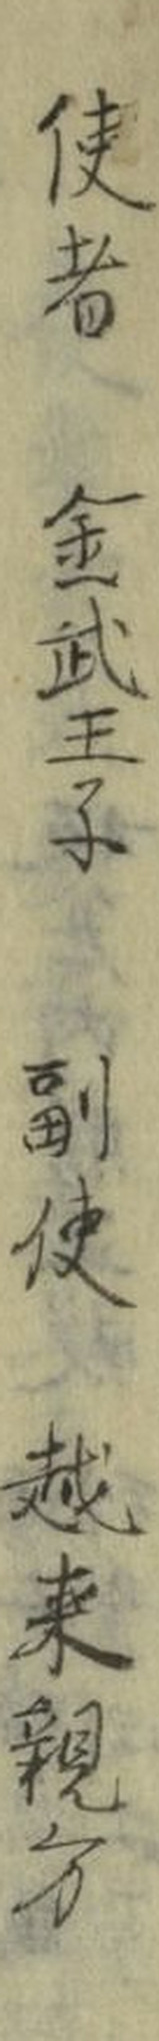使者金武王子副使越来親方
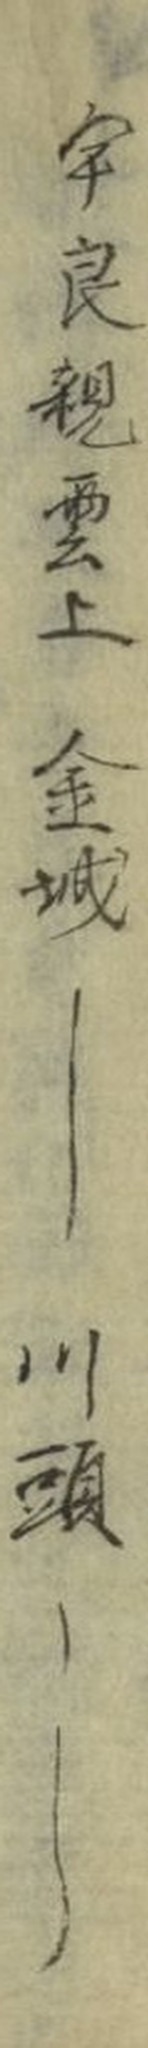宇良親雲上金城────川頭────
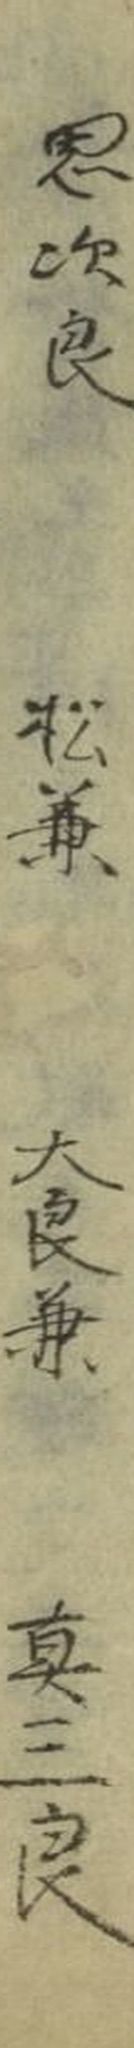思次良松兼大良兼真三良
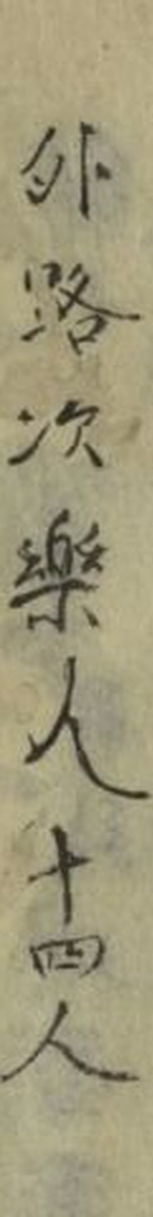外路次楽人十四人

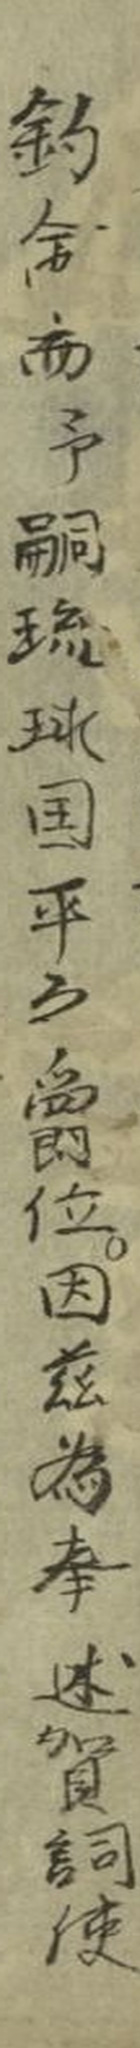釣而予嗣琉球国平定爵位。因茲為奉述賀詞使
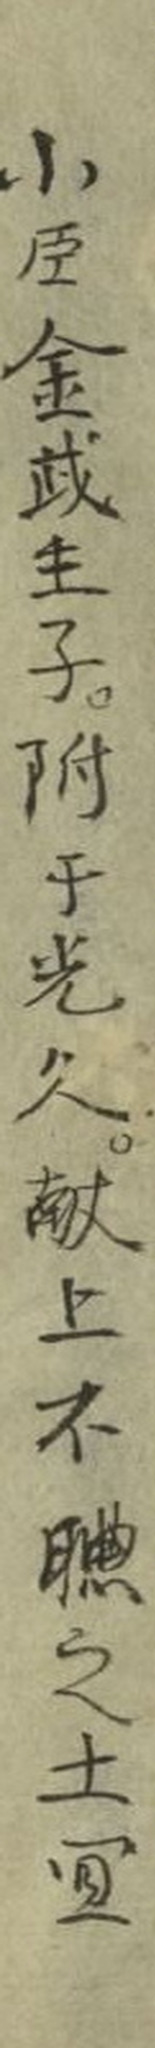小臣金武王子。附于光久。献上不腆之土宜
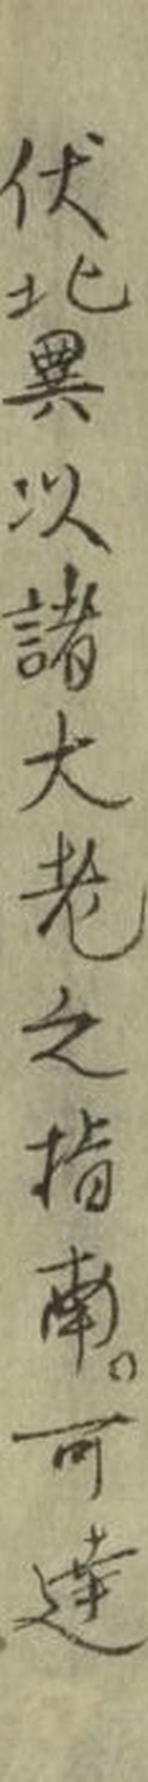伏北異以諸大老之指南。可達
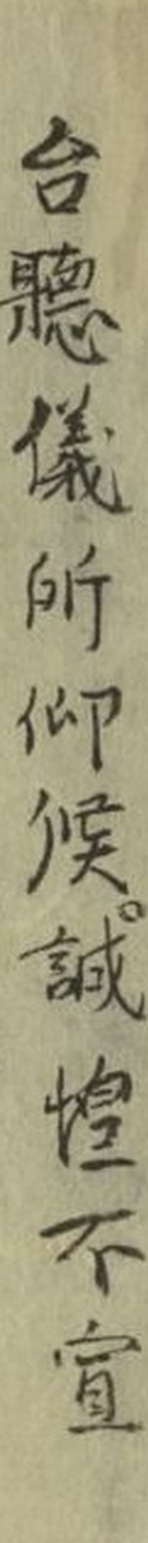台聴儀所仰候。誠惶不宣
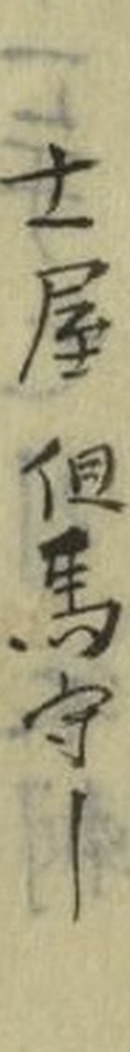土屋但馬守─
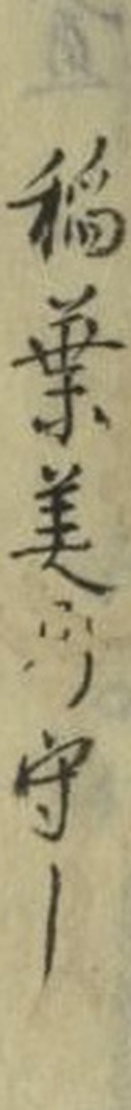稲葉美濃守─
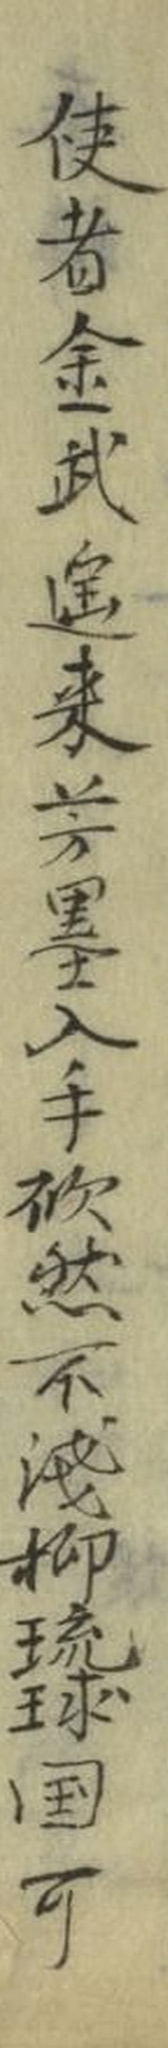使者金武遥来芳墨入手欣然不浅柳琉球国可
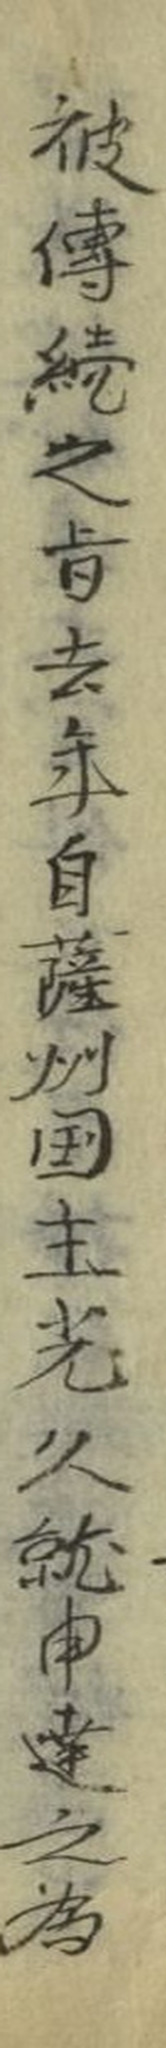被伝続之旨去年自薩州国主光久就申達之為
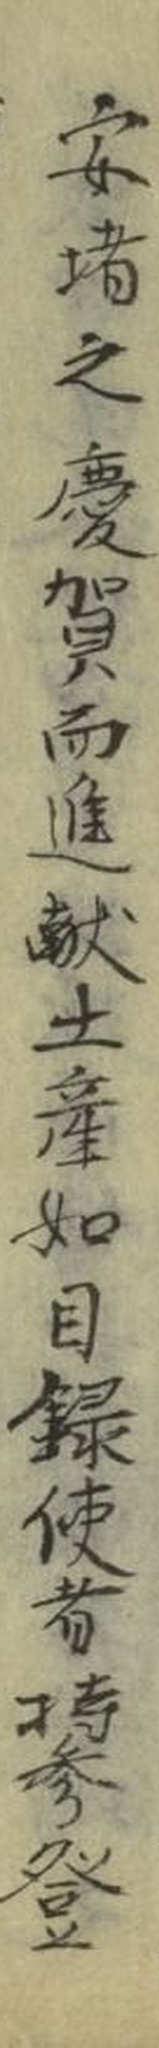安堵之慶賀而進献土産如目録使者持参登
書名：琉球紀事
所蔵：University of the Ryukyus Library
